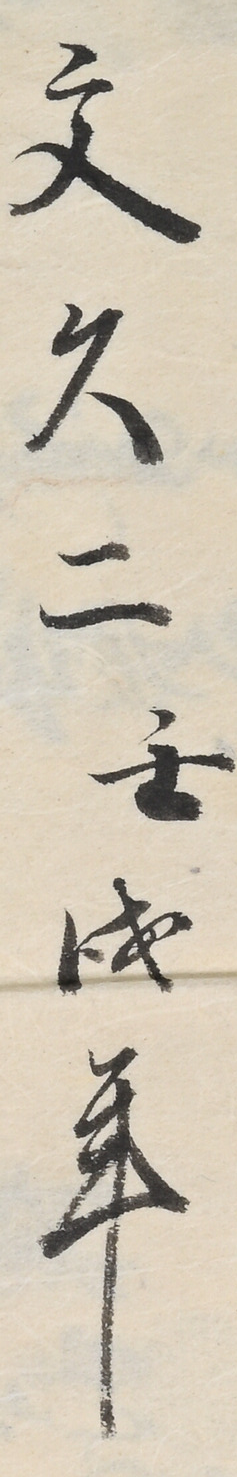文久二壬戌年
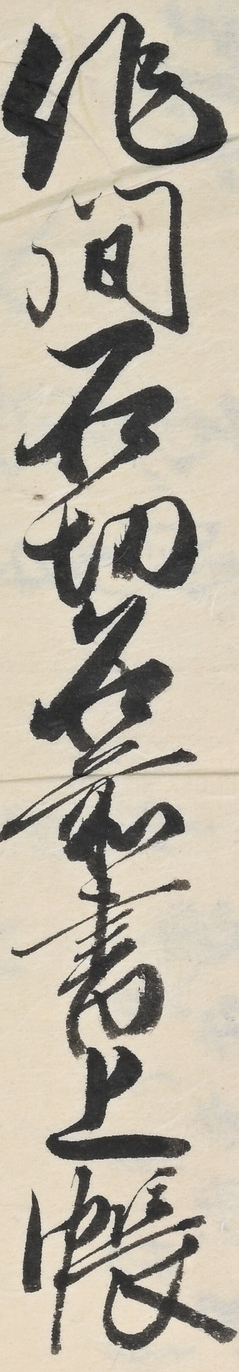作間石切名前書上帳

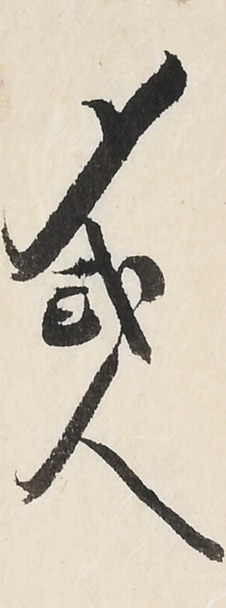〆弐人
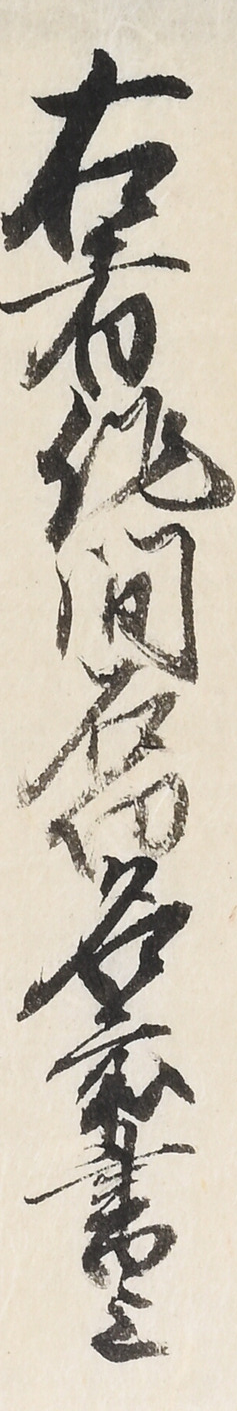右者作間石切名前書上
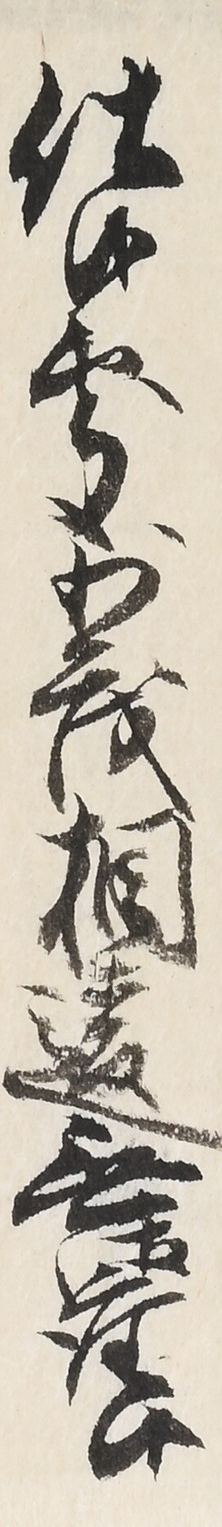仕候処少茂相違無御座候
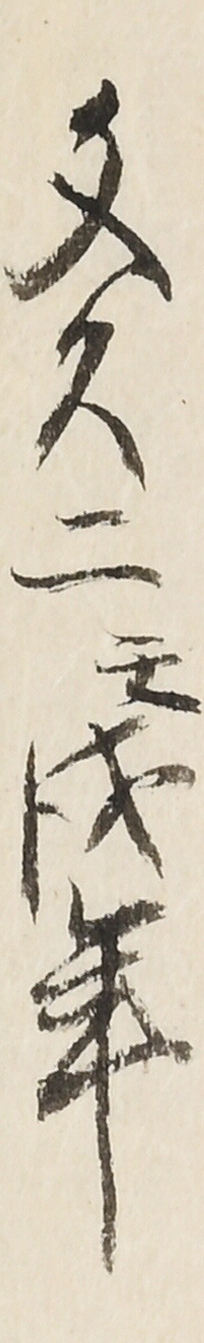文久二壬戌年
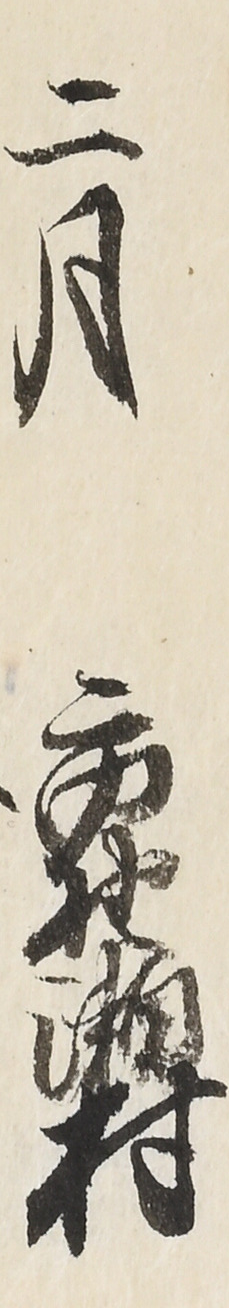二月市野瀬村
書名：文久二壬戌年二月作間石切名前書上帳
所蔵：伊那市立高遠町図書館・合同会社AMANE
